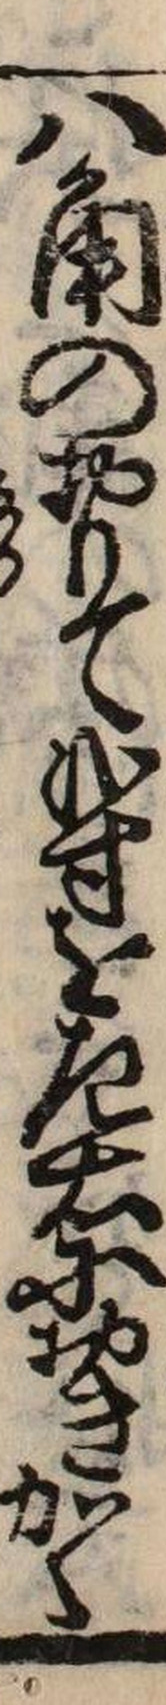八角のおもて弐寸を左右におきかく
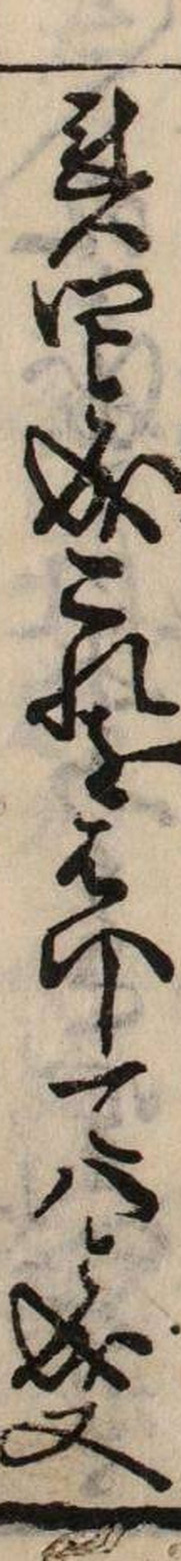れ六四と成これをはいして八と成又
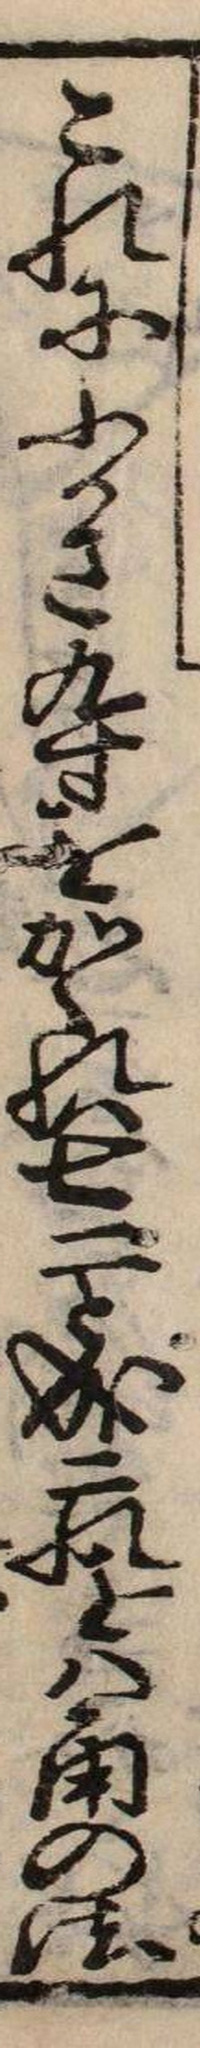これにふかさ九寸をかくれは七二と成これを八角の法

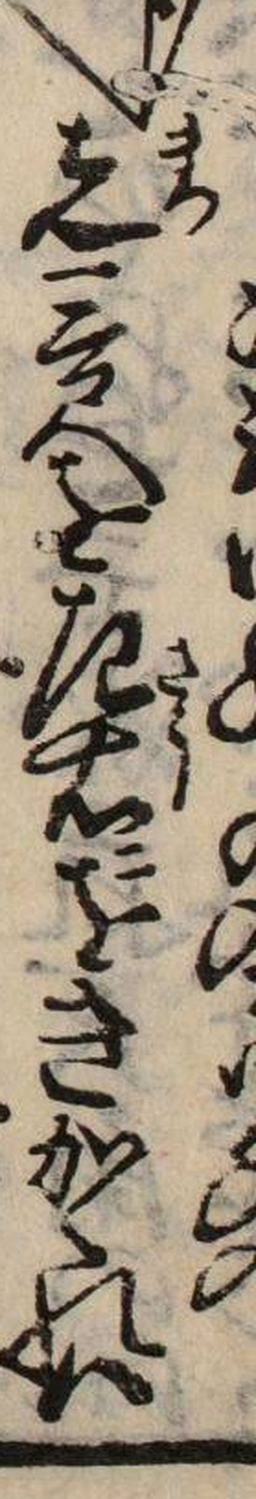先三尺を左右にをきかくれは
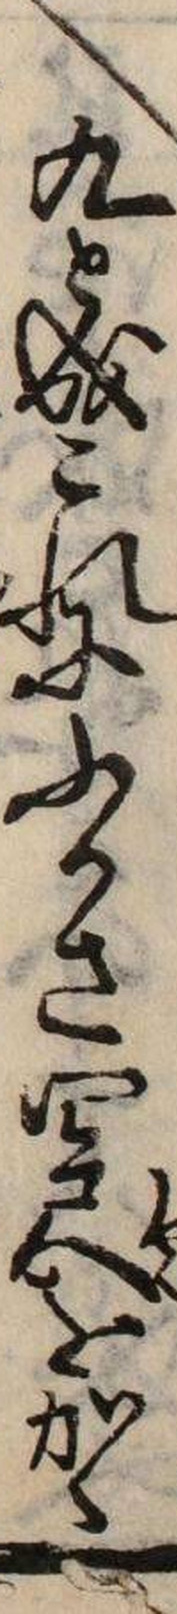九と成これにふかさ四尺をかく
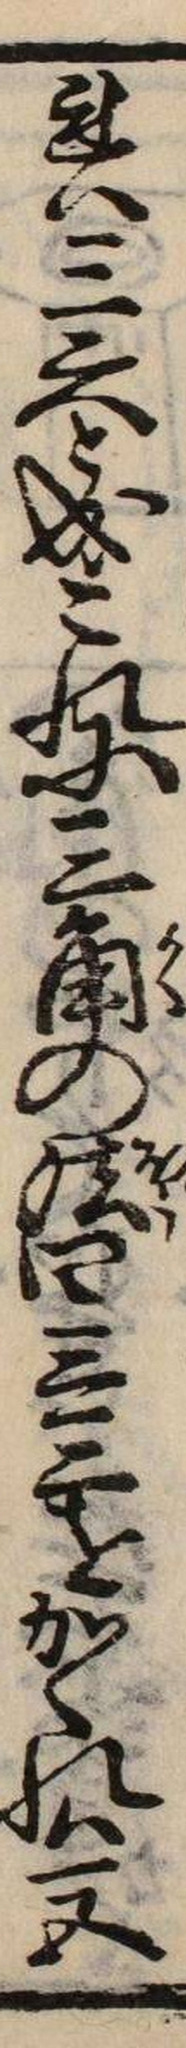れは三六と成これに三角の法四三三をかくれは一五
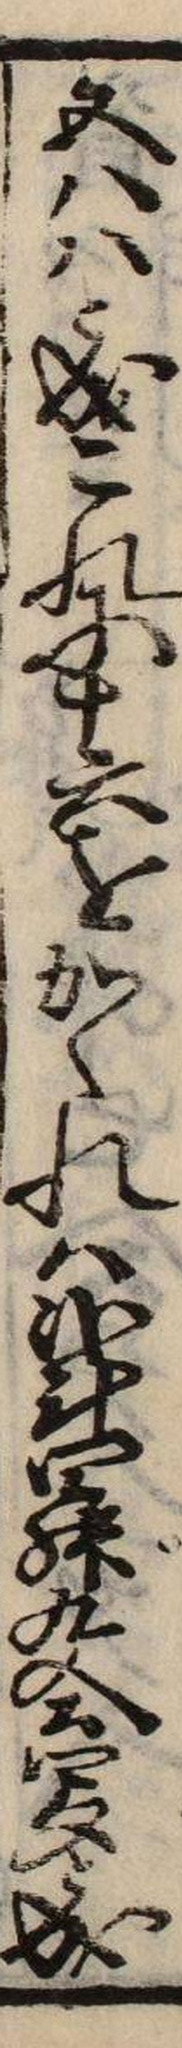五八八と成これに十六をかくれは弐斗四升九合四勺と成
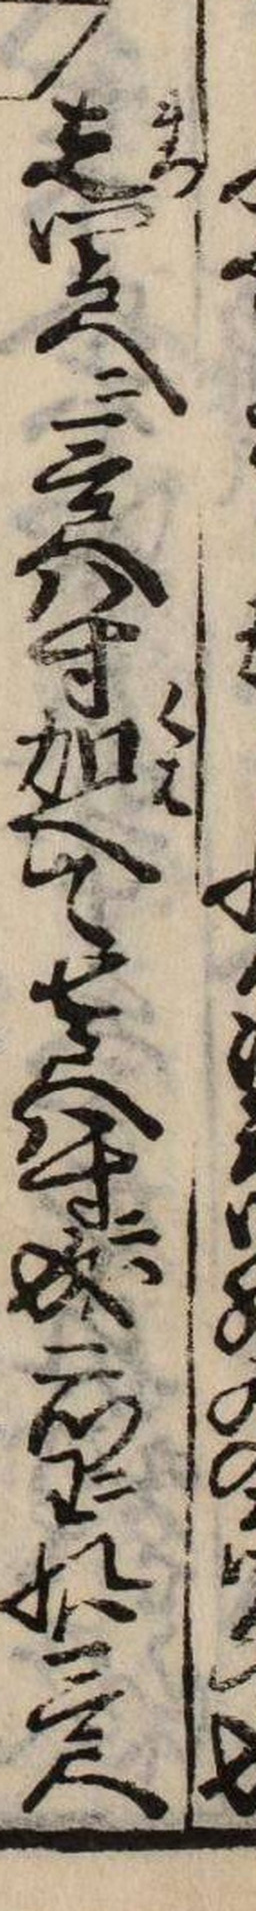先四尺に三尺八寸加へて七尺八寸に成二つにわれは三尺
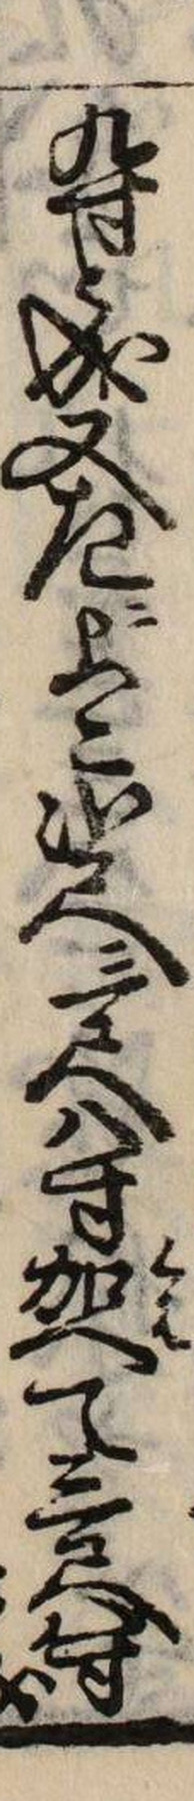九寸と成又左によこ弐尺に一尺八寸加へて三尺八寸と成
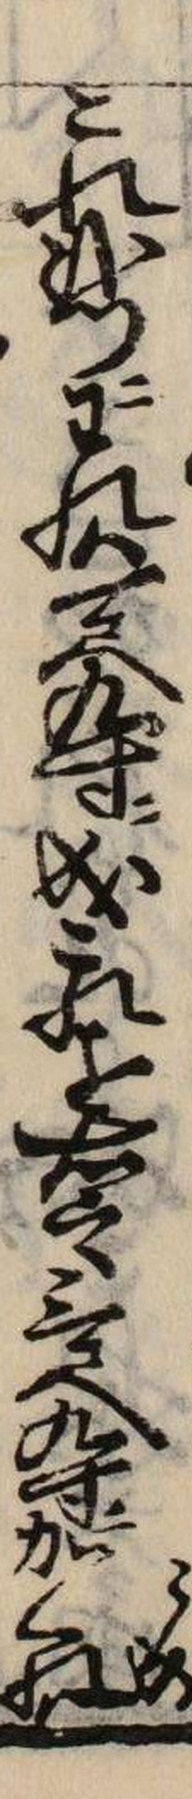これ弐つにわれは一尺九寸に成これを右之三尺九寸にかくれは
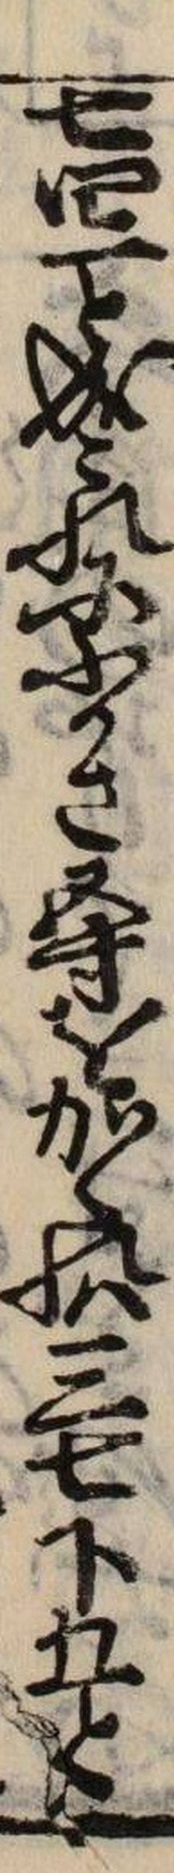七四一とと成これにふかさ五寸をかくれは三七下五と
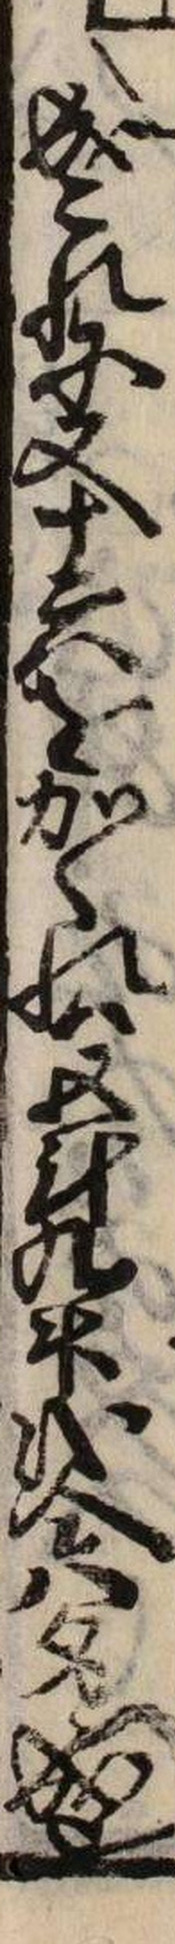成これに又十六をかくれは五斗九升弐合八勺と成也
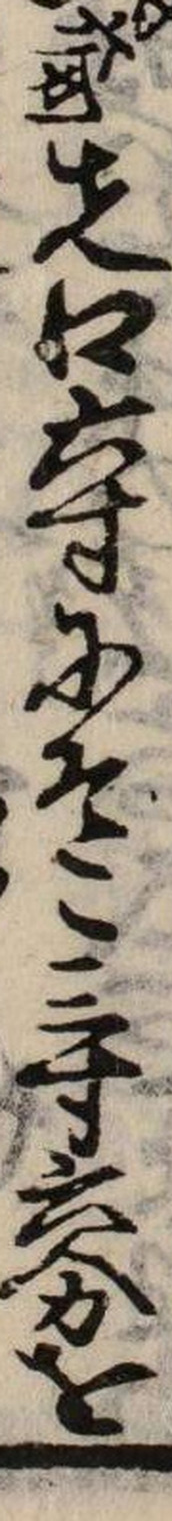先口六寸にそこ三寸六分を
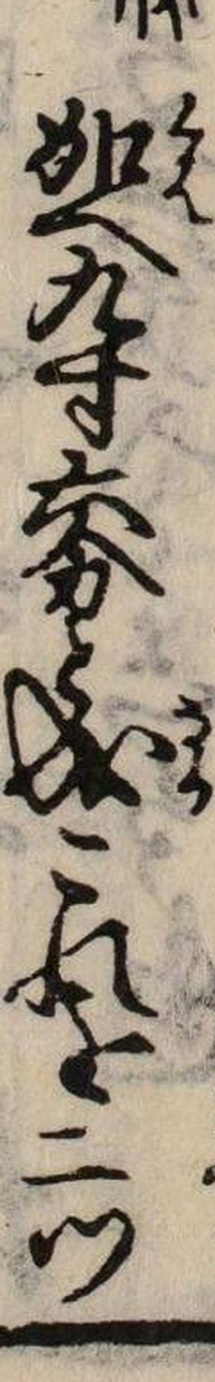加へ九寸六分と成これを二つ
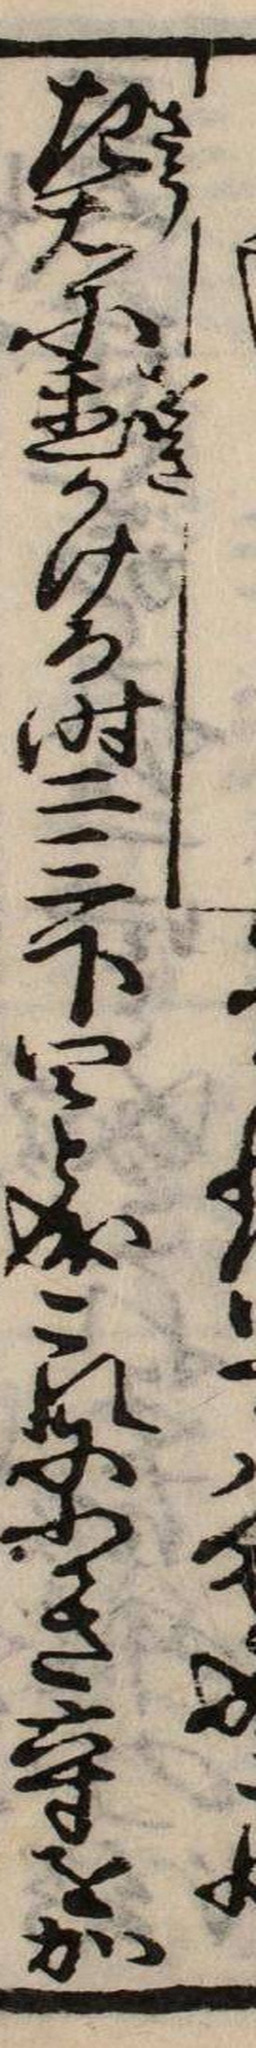左右に置かける時二三下四と成これにふかさ六寸をか
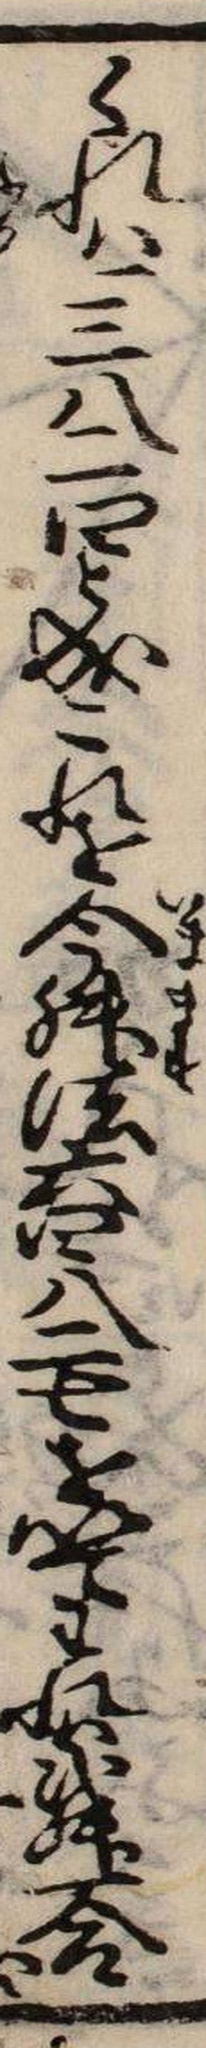くれは一三八二四と成これを今舛法六四八二七を以てわれは弐升一合三勺と成
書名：塵劫記（寛永11年自跋、京都府立京都学・歴彩館追貴8）
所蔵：京都府立京都学・歴彩館 国文学研究資料館
